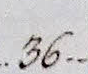36
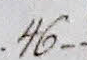46
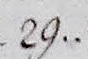29
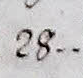28
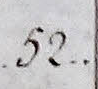52
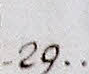29
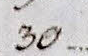30
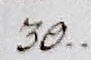30
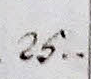25
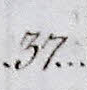37
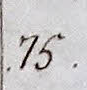75
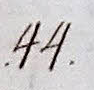44
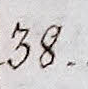38
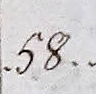58
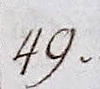49
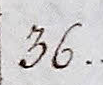36
